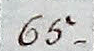65
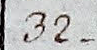32
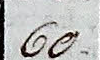60
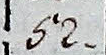52
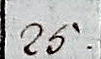25
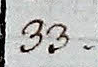33
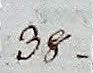38
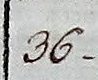36
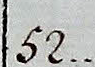52
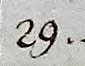29
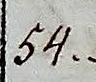54
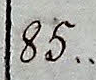85
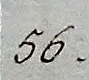56
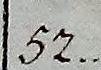52
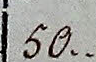50
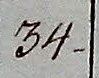34
